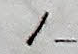1
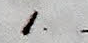1.
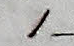1
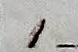1
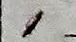1
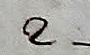2
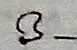3
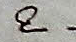2
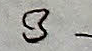3
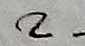2
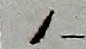1
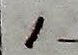1
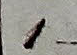1
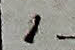1
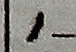1
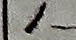1
